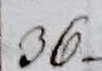36
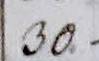30
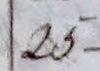25
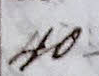40
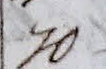70
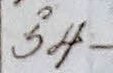54
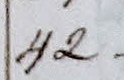42
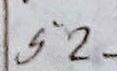52
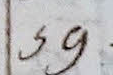59
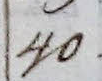40
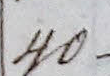40
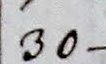30
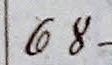68
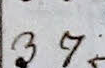37
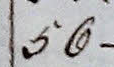56
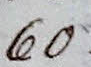60
